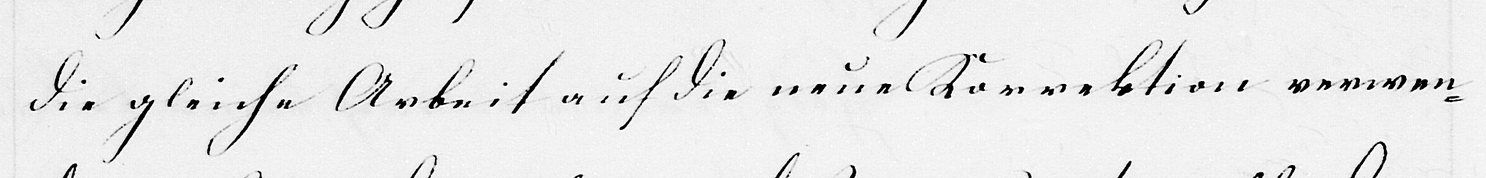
die gleiche Arbeit auf die neue Korrektion verwen¬
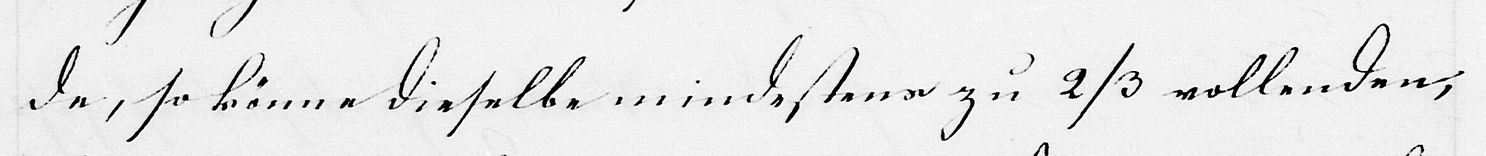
de, so könne dieselbe mindestens zu 2/3 vollenden,
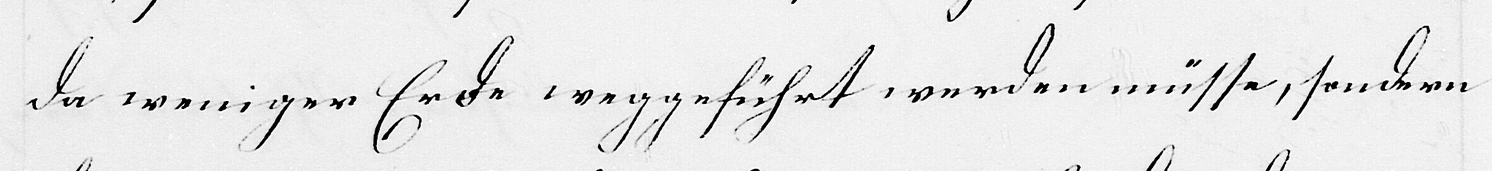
da weniger Erde weggeführt werden müsse, sondern
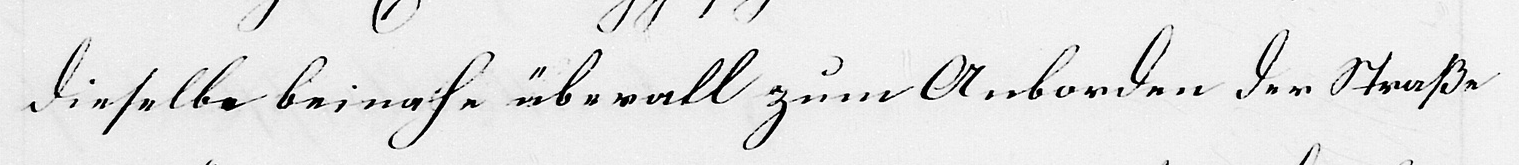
dieselbe beinahe überall zum Anborden der Straße
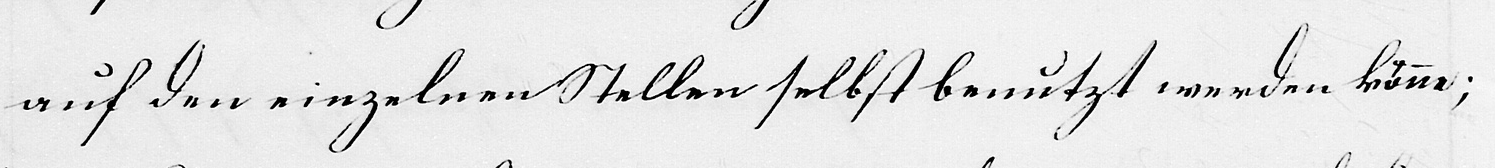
auf den einzelnen Stellen selbst benutzt werden könne;
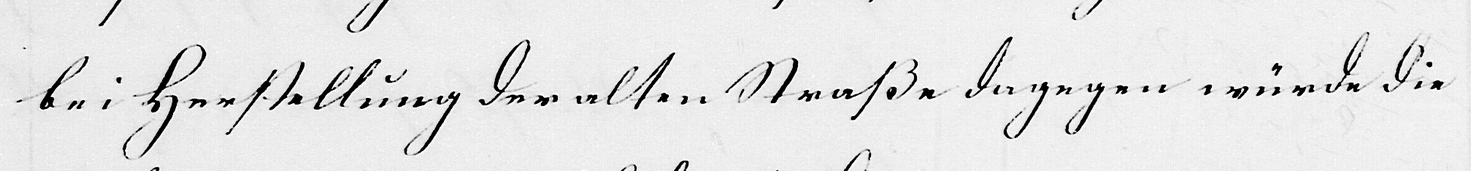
bei Herstellung der alten Straße dagegen würde die
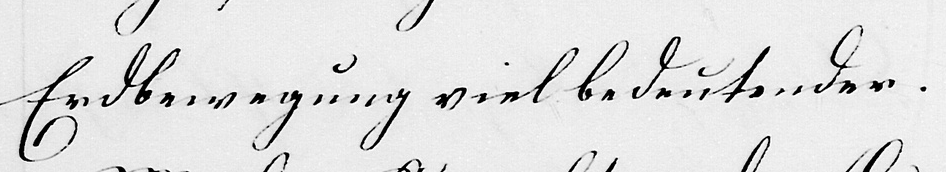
Erdbewegung viel bedeutender.
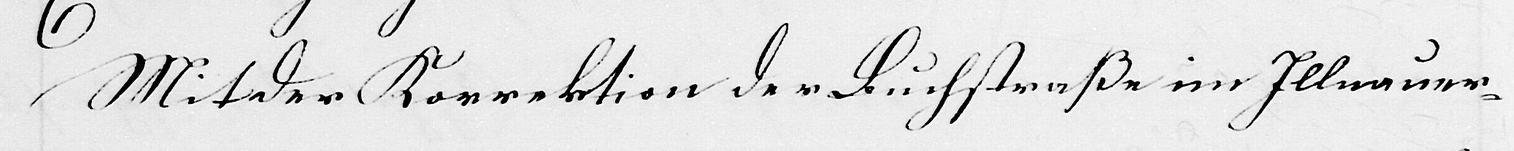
Mit der Korrektion der Buchstraße im Illnauer¬
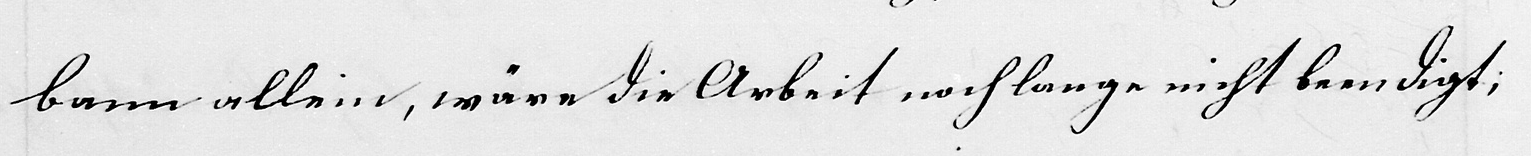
bann allein, wäre die Arbeit noch lange nicht beendigt,
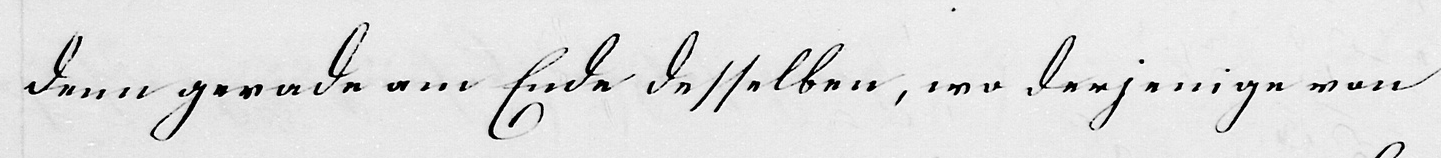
denn gerade am Ende desselben, wo derjenige von
